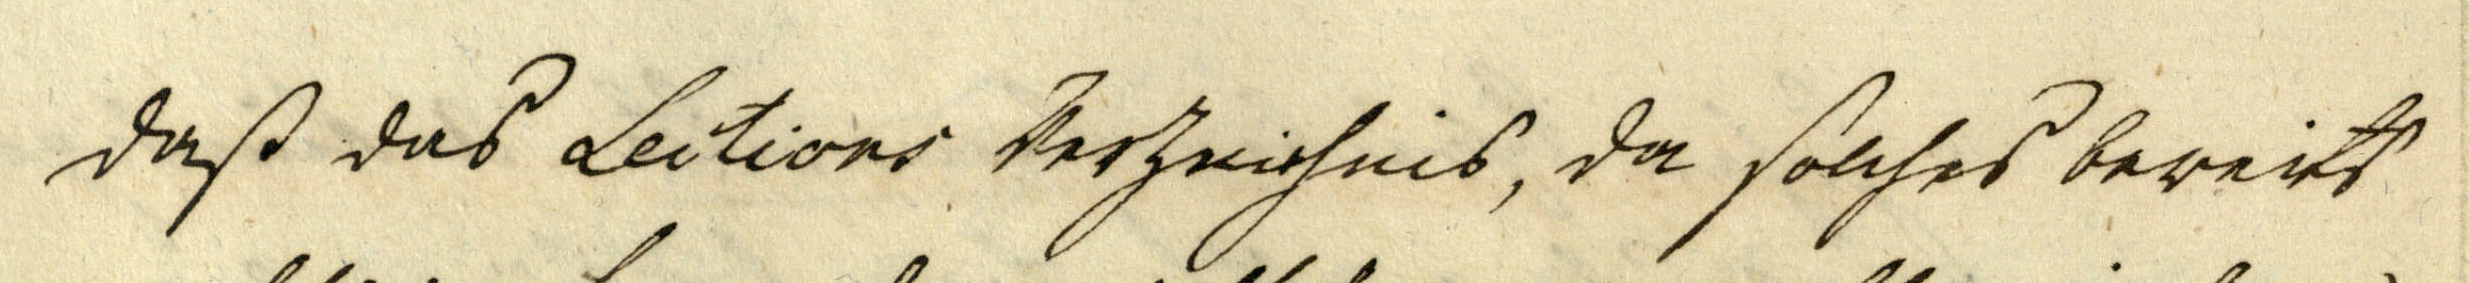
daß das Lections Verzeichnis, da solches bereits
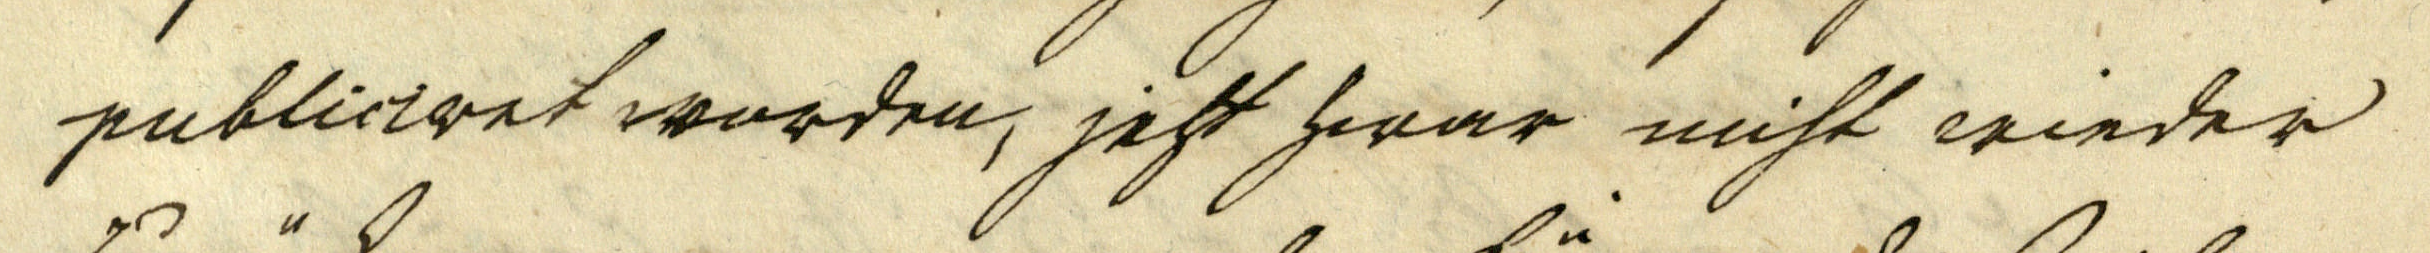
publiciret worden, jetzt zwar nicht wieder
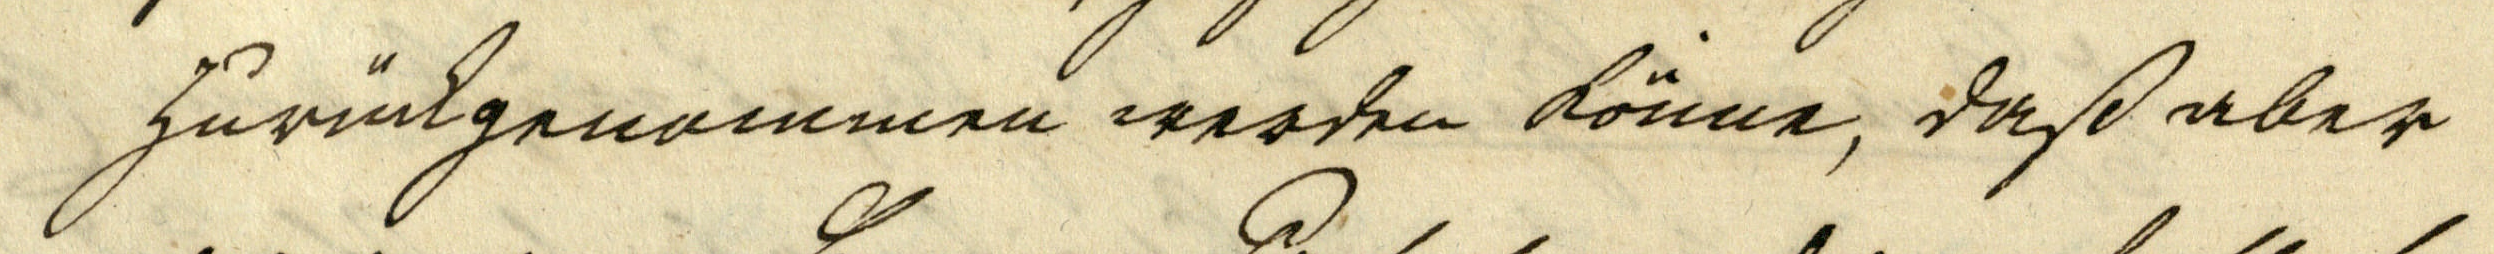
zurückgenommen werden könne, daß aber
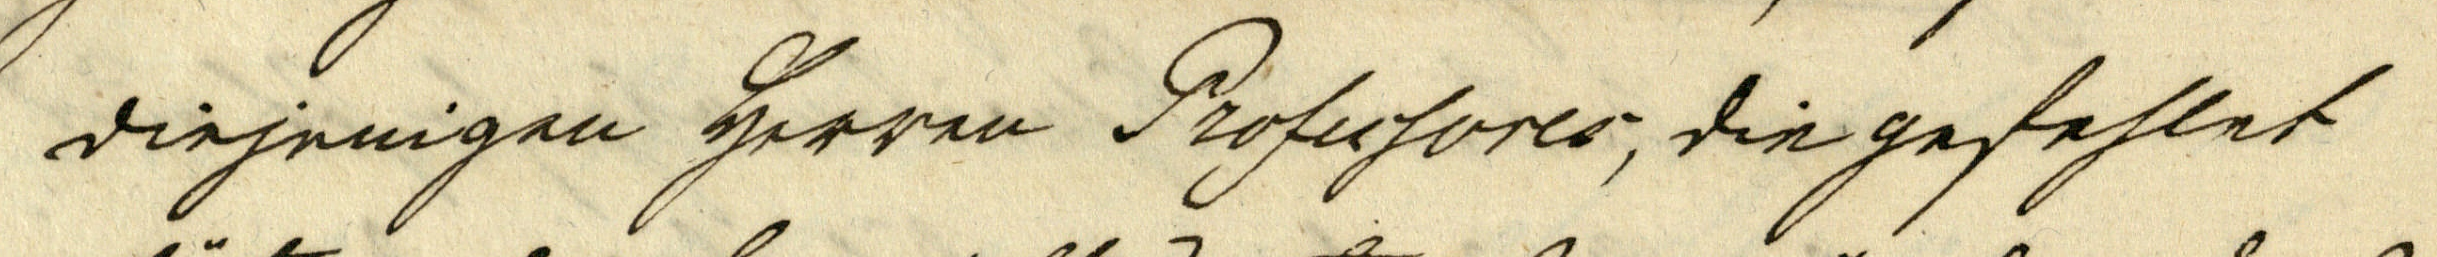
diejenigen Herren Professores, die gefehlet
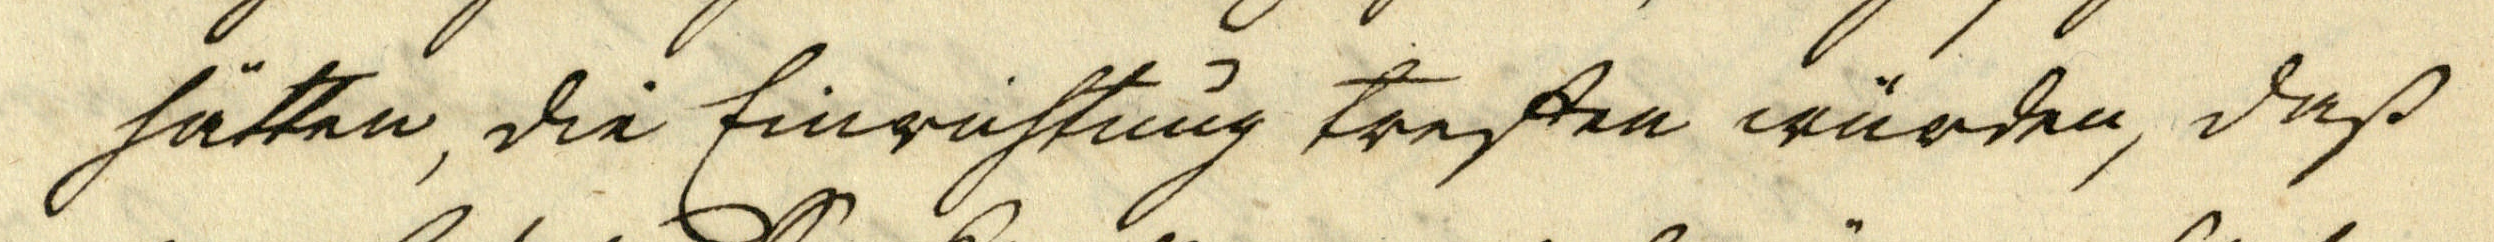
hätten, die Einrichtung treffen würden, daß
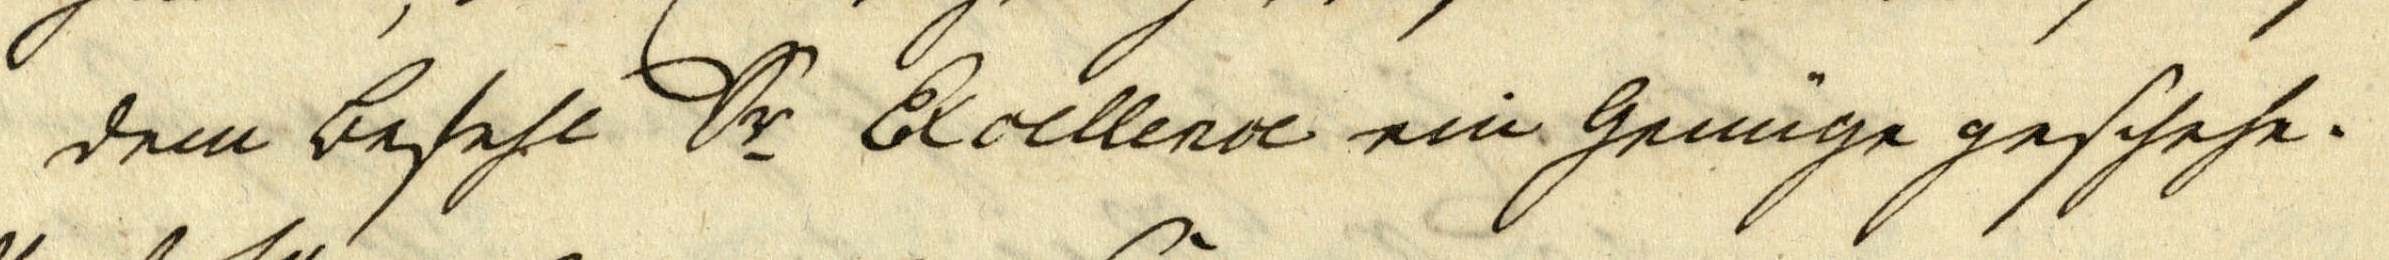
dem Befehl Sr Excellence ein Genüge geschehe.
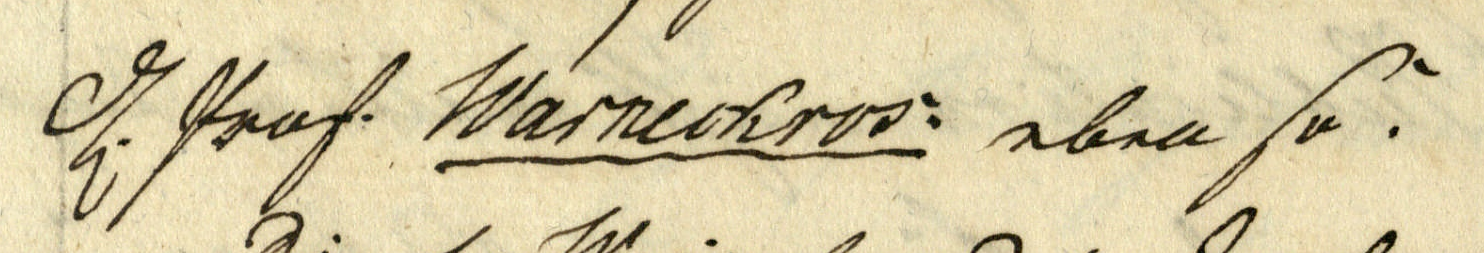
dh. Prof. Warneckros: eben so.
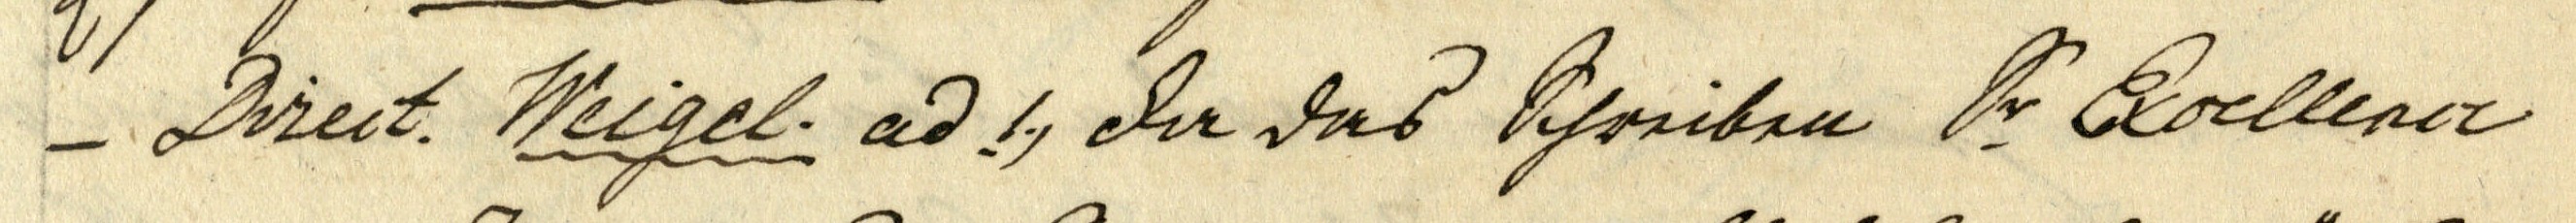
Direct. Weigel. ad 1., Da das Schreiben Sr Excellence
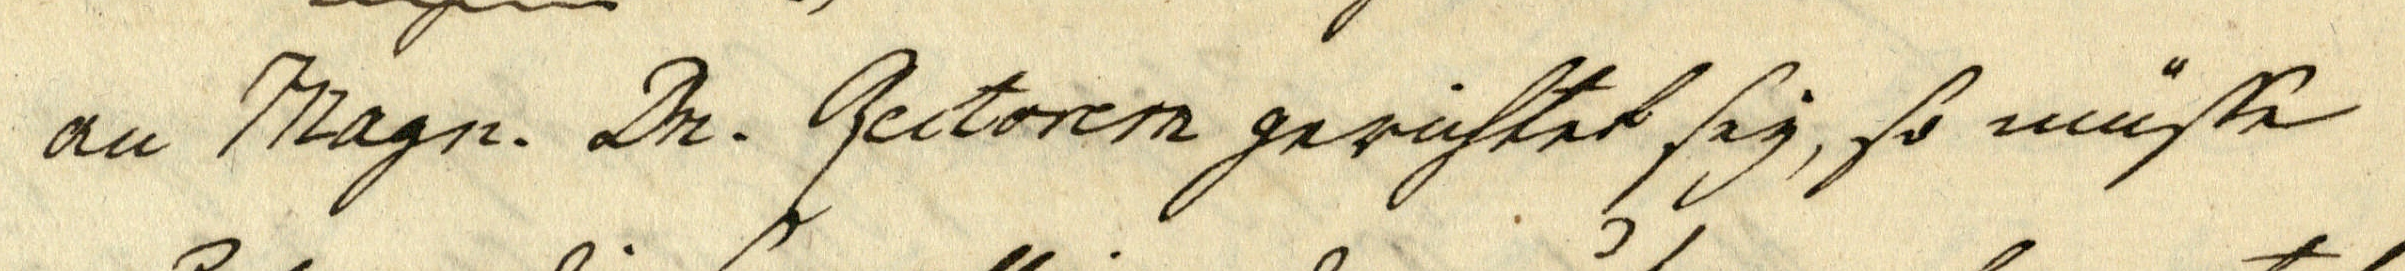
an Magn. Dn. Rectorem gerichtet seÿ, so müsse
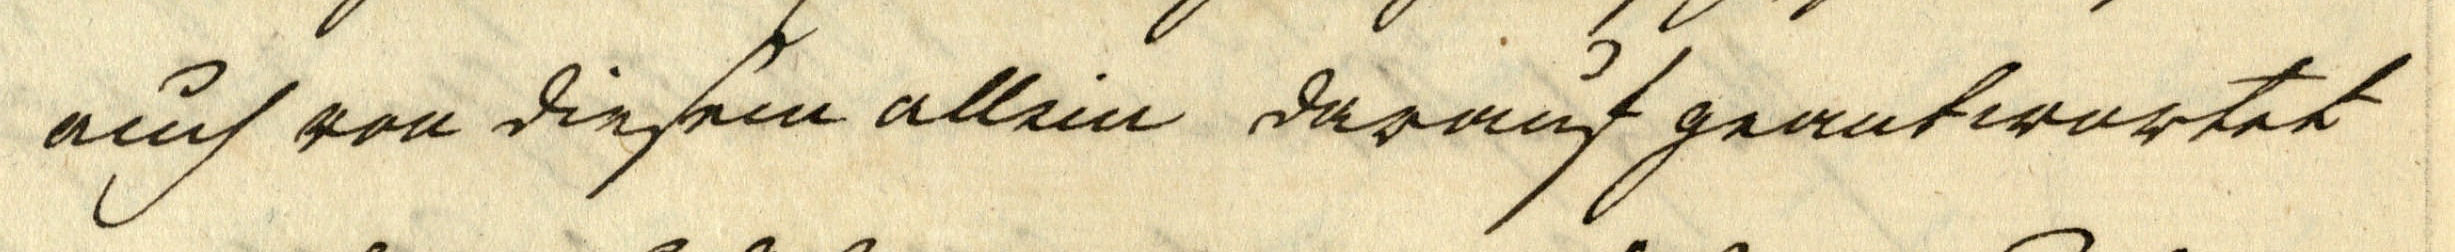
auch von diesem allein darauf geantwortet
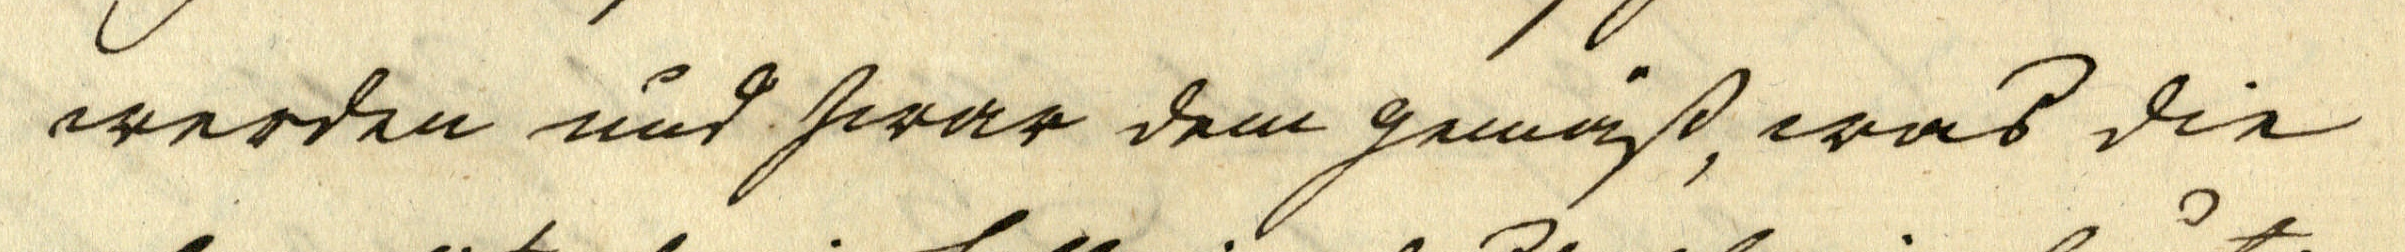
werden und zwar dem gemäß, was die
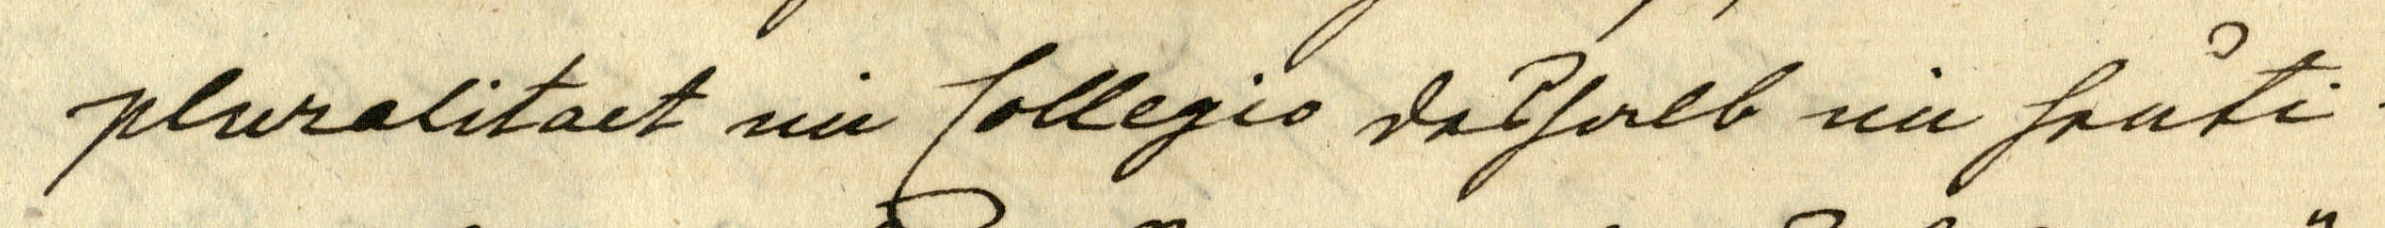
pluralitaet im Collegio deshalb im heuti¬
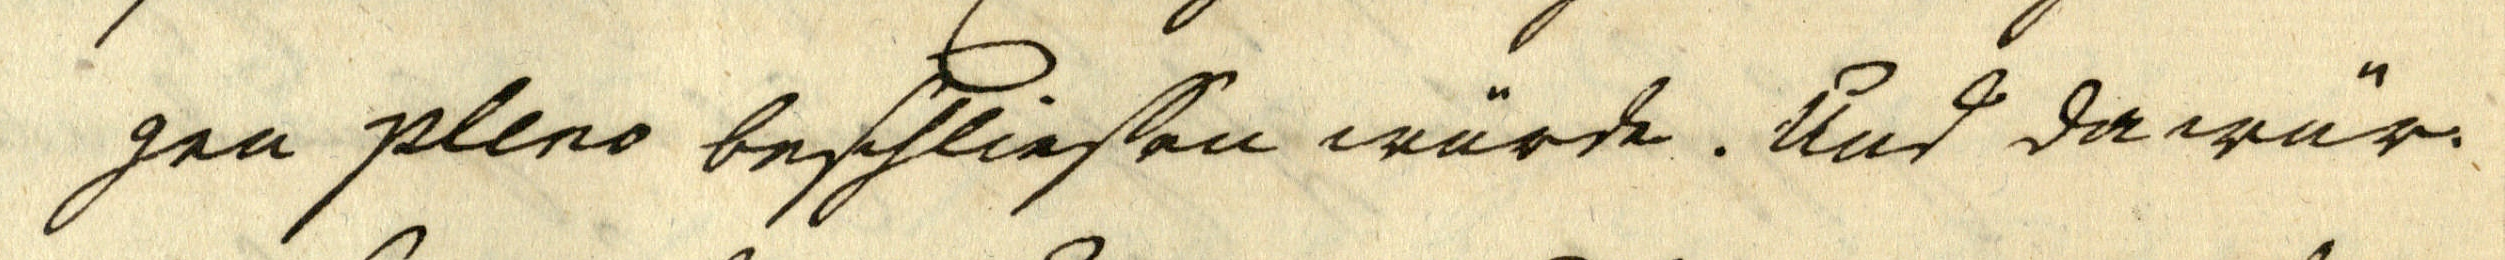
gen pleno beschliessen würde. Und da wür¬
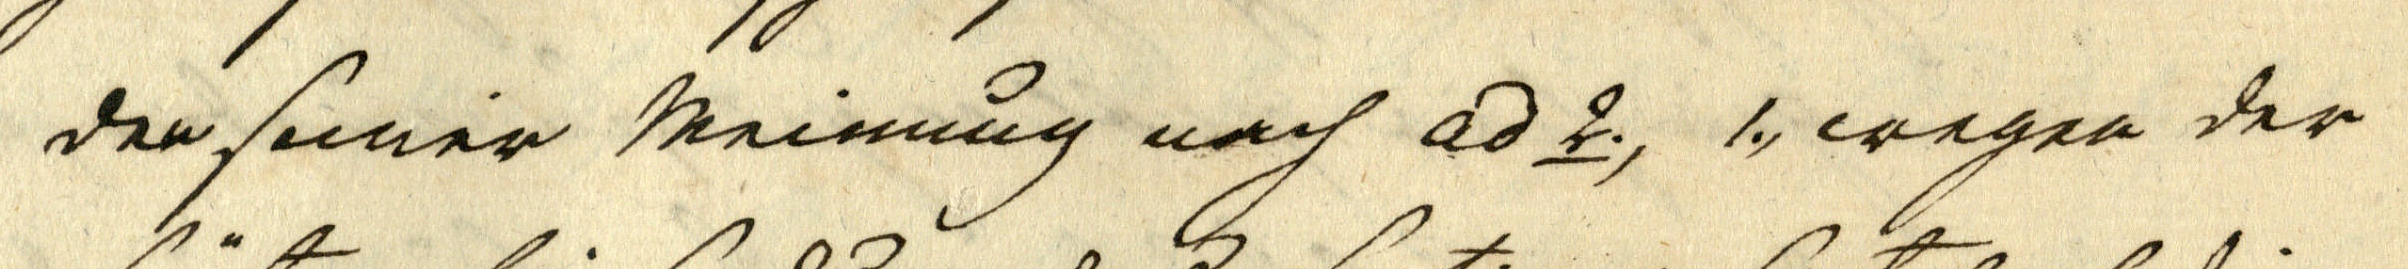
den seiner Meinung nach ad 2., 1., wegen der
